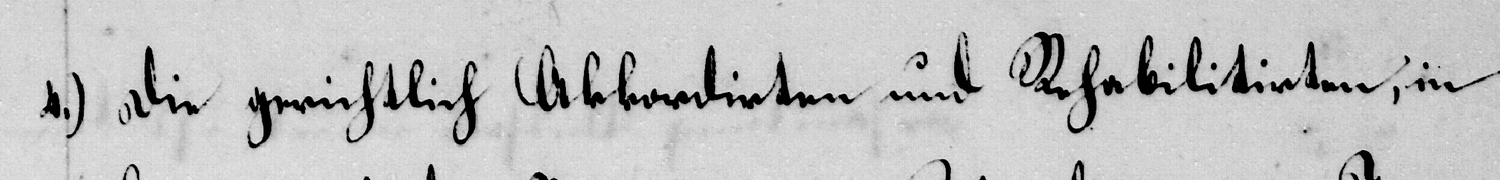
4.) Die gerichtlich Akkordirten und Rehabilitirten, in
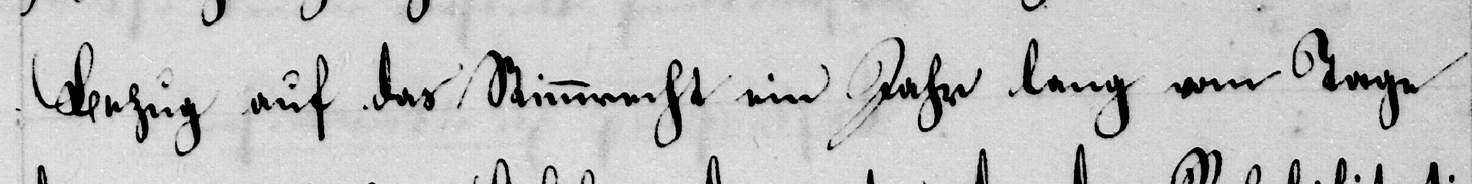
Bezug auf das Stimmrecht ein Jahr lang vom Tage
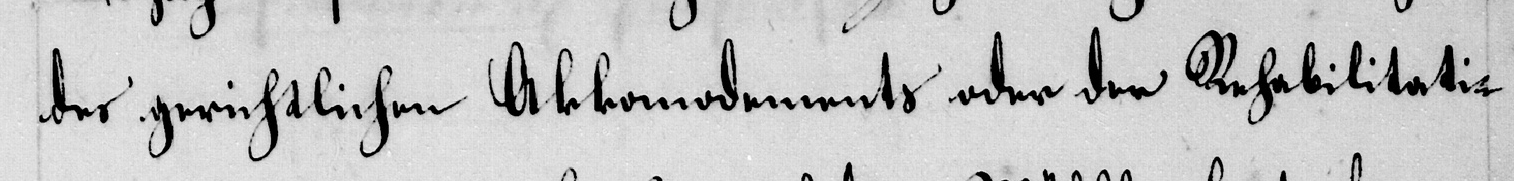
des gerichtlichen Akkomodements oder der Rehabilitatio¬
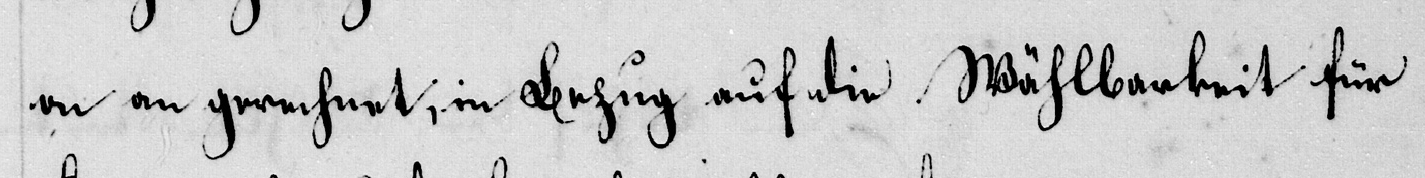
n an gerechnet, in Bezug auf die Wählbarkeit für
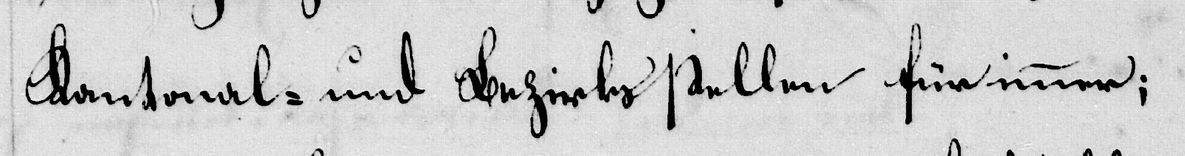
Kantonal- und Bezirksstellen für immer;
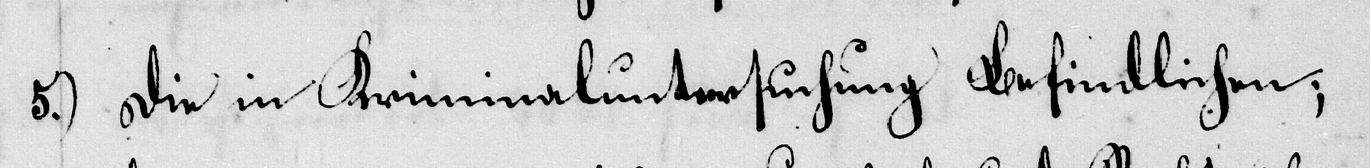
5.) Die in Kriminaluntersuchung befindlichen;
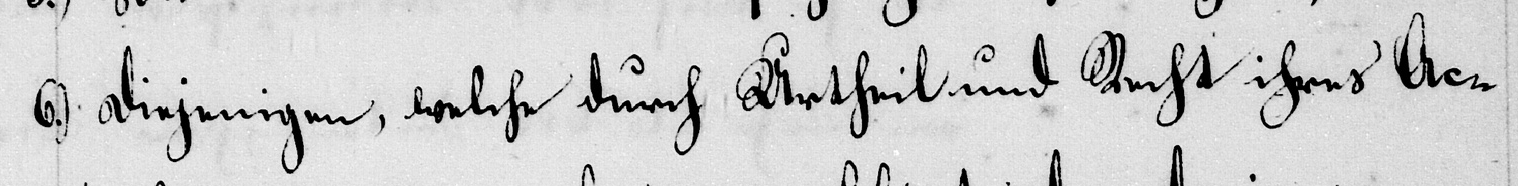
6.) Diejenigen, welche durch Urtheil und Recht ihres Ac¬
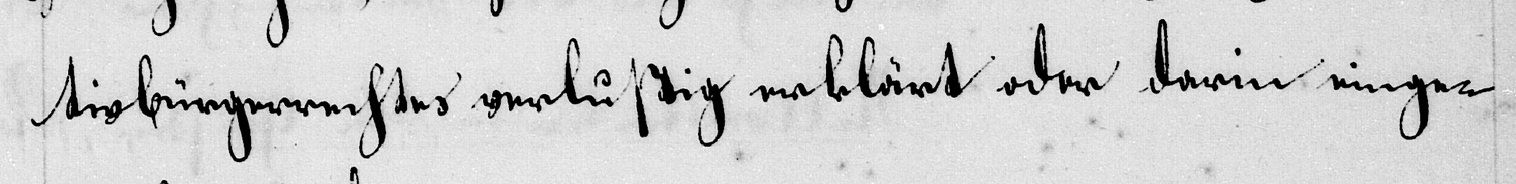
tivbürgerrechtes verlustig erklärt oder darin einge¬
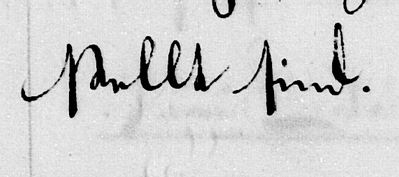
stellt sind.
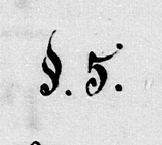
§.5.
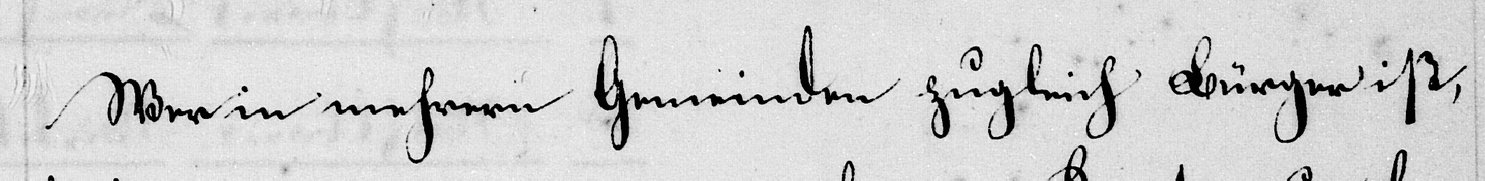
Wer in mehrern Gemeinden zugleich Bürger ist,
